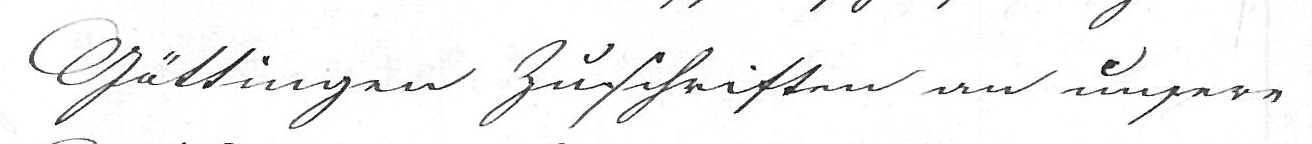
Göttingen Zuschriften an unsere
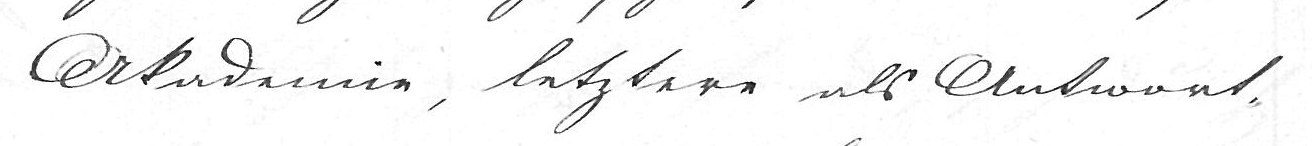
Akademie, letztere als Antwort-
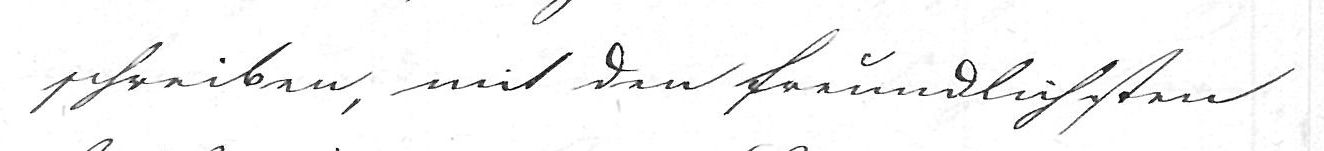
schreiben, mit den freundlichsten
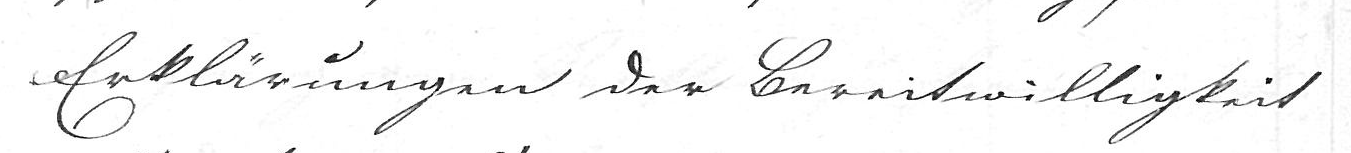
Erklärungen der Bereitwilligkeit
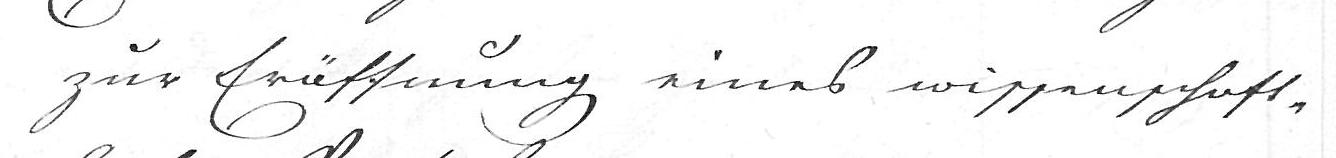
zur Eröffnung eines wissenschaft-
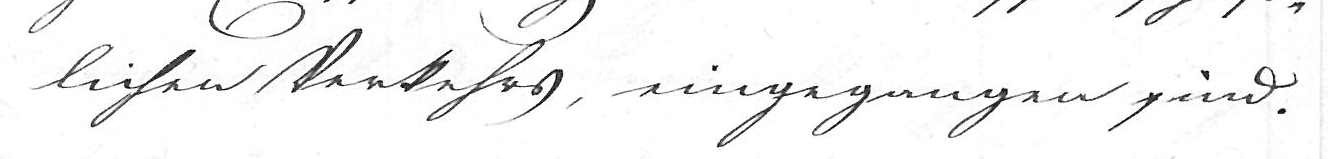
lichen Verkehrs eingegangen sind.
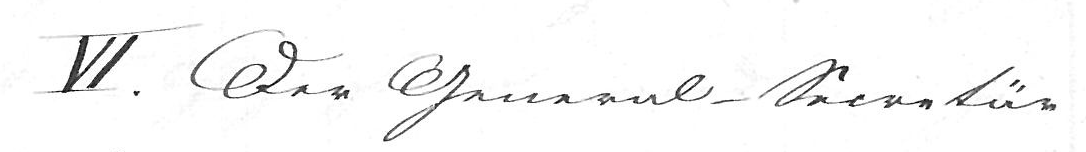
VI. Der General-Secretär
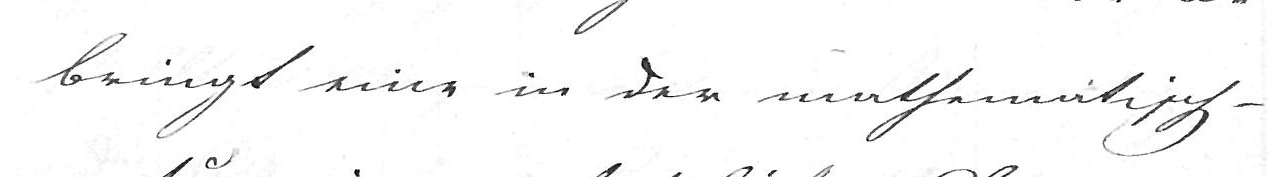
bringt eine in der mathematisch-
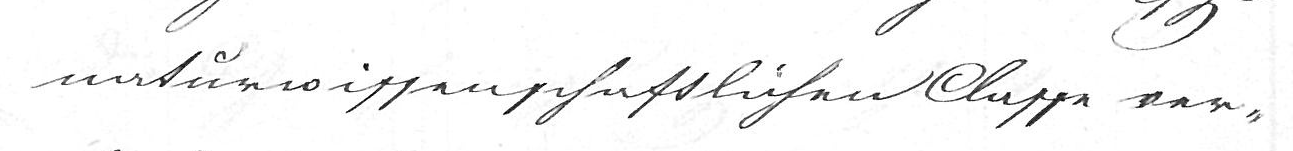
naturwissenschaftlichen Classe ver-
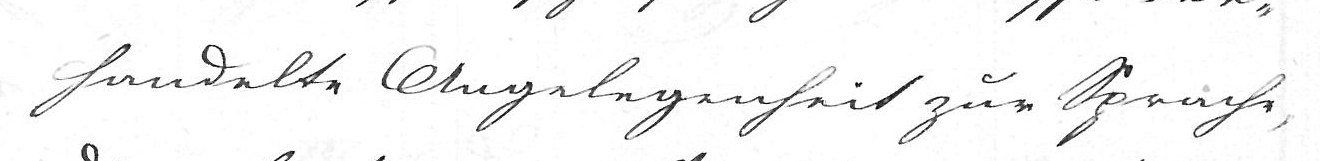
handelte Angelegenheit zur Sprache,
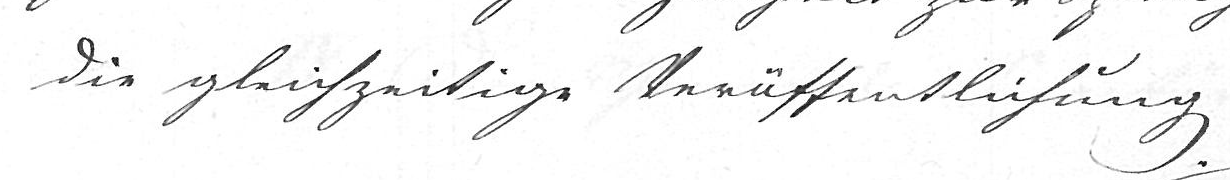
die gleichzeitige Veröffentlichung
